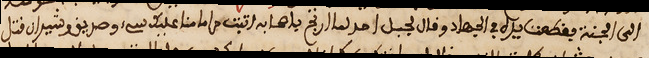الى الجنة فقطعت يده في الجهاد وقال لجبل احر لما ارتج باصحابه اتبت حراما منا عليك شىء وصديق وشهيد ان قتل
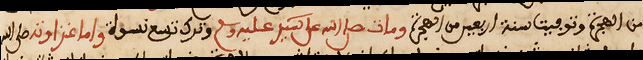من الهجرة وتوفيت سنة اربعين من الهجرة ومات صلى الله سيد عليه وسلم وترك وتسع نسوة واما غزواته صلى الله
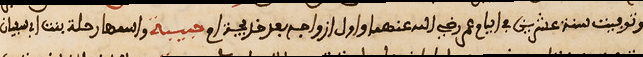وتوفيت سنة عشرين في ايام عمر رضي الله عنهما واول ازواجه بعد خديجة ام حبيبة واسمها رحلة بنت ابى سفيان
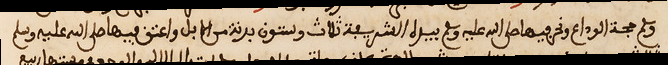وسلم حجة الوداع ونحر فيها صلى الله عليه وسلم بيده الشريفة ثلاث وستون بدنة من الابل واعتق فيها صلى الله عليه وسلم
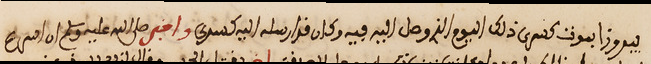فيروزا بموت كسرى ذلك اليوم الذي وصل اليه فيه وكان قد ارسله اليه الكسرى واخبر صلى الله عليه وسلم ان اسرع
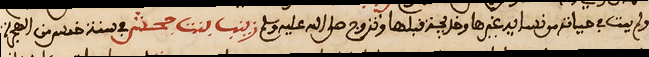ولم يمت في حياته من نسايه غيرها وخديجة قبلها وتزوج صلى الله عليه وسلم زينب بنت جحش في سنة خمس من الهجرة
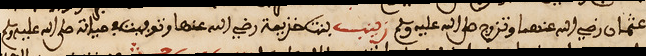عثمان رضي الله عنهما وتزوج صلى الله عليه وسلم زينب بنت خزيمة رضي الله عنها وتوفيت في حياته صلى الله عليه وسلم
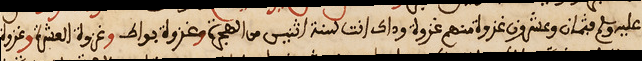عليه وسلم فثمان وعشرون غزوة منهم غزوة ودا كانت لسنة اثنين من الهجرة وغزوة بواط وغزوة العشرة وغزوة
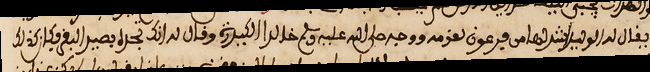يقال له الوليد اشر لها من فرعون لقومه ووجه صلى الله عليه وسلم خالد الكبدرة وقال له انك تجده بصيد البقر فكان كذلك
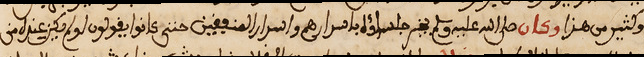وكثير من هذا وكان صلى الله عليه وسلم يخبر حلساؤه باسرارهم واسرار المنفقين حتى كانوا يقولون لو لم يكن عنده من
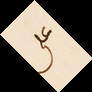على
